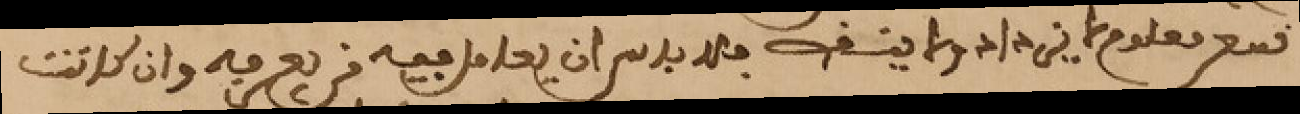فسعر معلوم لا يزداد ولا ينقص فهو باس ان يعامل فيه من يعرفه وان كانت
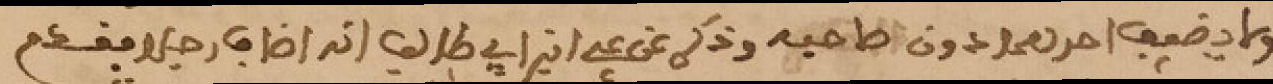ولا يضيف احدهما دون صاحبه وذكر عن علي ابن ابي طالب انه اضاف رجلا فقدم
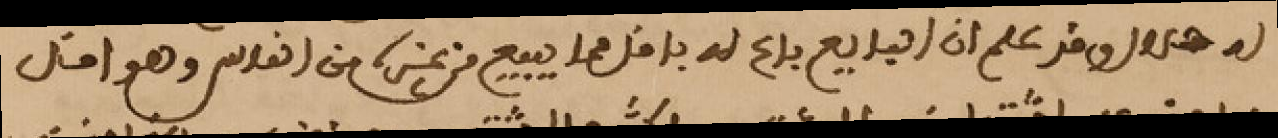له حلال وقد علم ان البايع باع له باقل مما يبيع من غيره من الناس وهو اقل
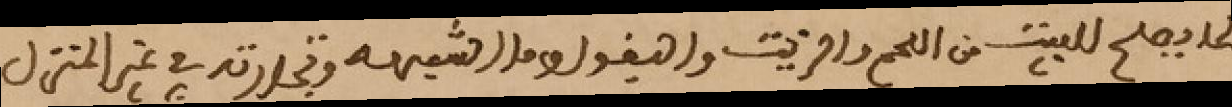لما يصلح للبيت من اللحم والزيت والبقول ما اشبهه وتجارته في غير المنزل
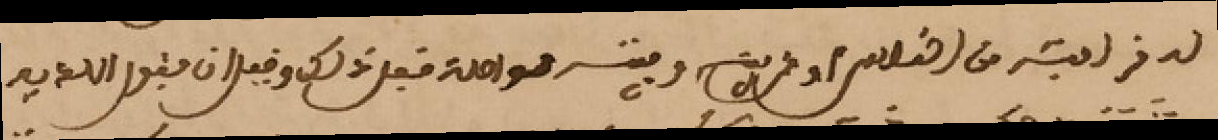له قرابته من الناس او من بيتى وبيته مواصلة قبل ذلك وقيل ان قبول الهدية
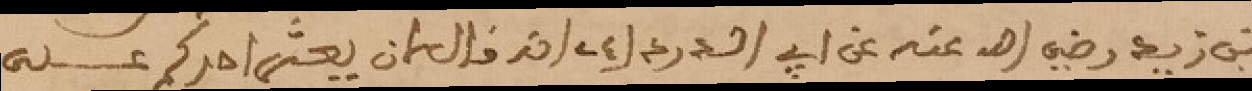بن زيد رضي الله عنه عن ابي الدرداء ءانه قال لان يعثر احدكم على
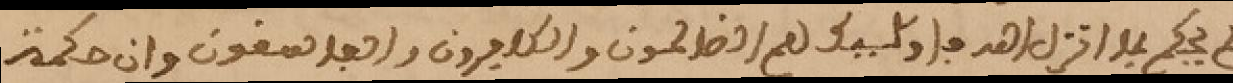لم يحكم بما انزل الله فاوليك هم الظالمون والكافرون والفاسقون وان حكمة
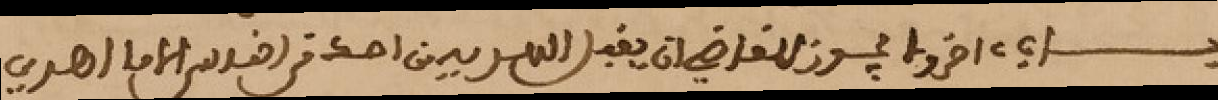باب ءاخر ولا يجوز للقاضي ان يقبل الهدية من احد من الناس الا ما اهدي
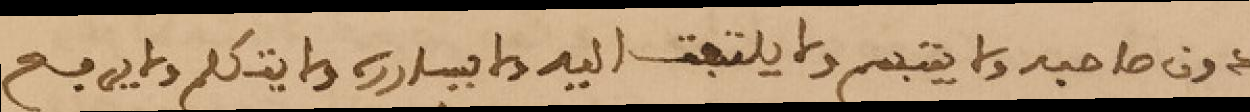دون صاجبه ولا يبتهم ولا يلتفت اليه ولا يسارره ولا يتكلم ولا يرفع
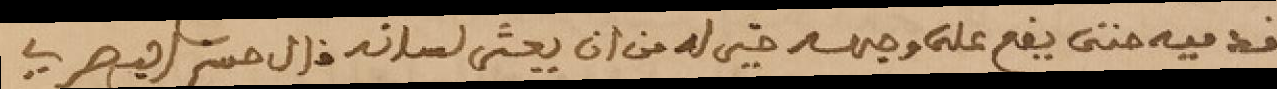قدميه حتى يقع على وجهه خير له من ان يعثر لسانه قال حسن البصري
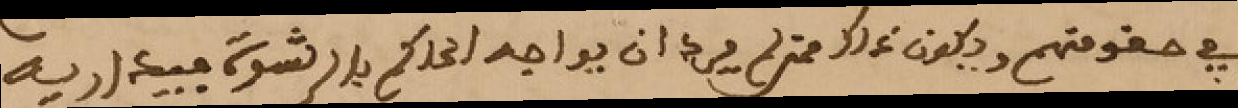في حقوقهم ويكون ذلك ممن لم يرد ان يواجه الحاكم بالرشوة فيداريه
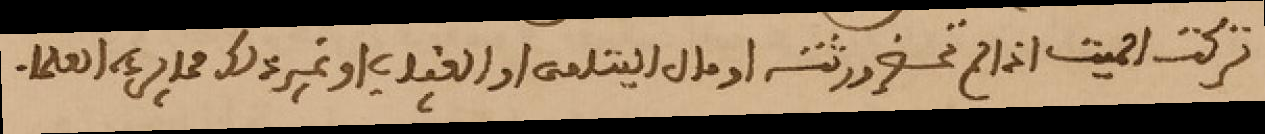تركة الميت اذا لم تحضر ورثته او مال اليتامى او الغياب او غير ذلك مما يرءه العلماء
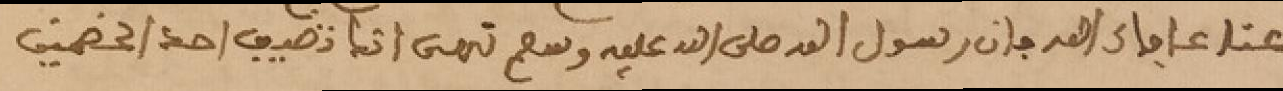عنا عافاك الله فان رسول الله صلى الله عليه وسلم نهى ان تضيف احد الخصمين
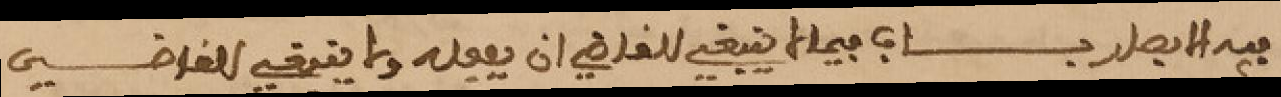فيه الابصار باب فيما لا ينبغي للقاضي ان يفعله ولا ينبغي للقاضي
